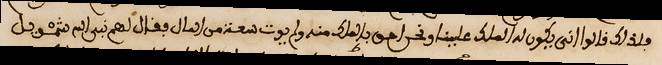فلذلك قالوا انى يكون له الملك علينا ونحن احق بالملك منه ولم يوت سعة من المال فقال لهم نبى الله شمويل
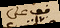قف على
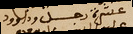عشرة رجل وداوود
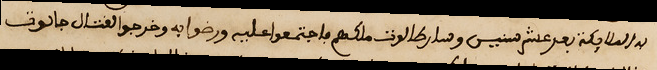به الملائكة بعد عشر سنين وسار طالوت ملكهم فاجتمعوا عليه ورضوا به وخرجوا لقتال جالوت
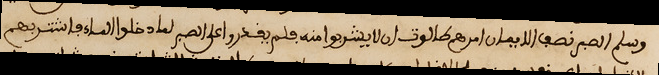وسلم الصبر نصف الايمان امرهم طالوت ان لا يشربوا منه فلم يقدروا على الصبر لما دخلوا الماء فاشتد بهم
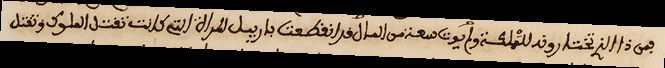فمن ذا الذي تختارونه للمملكة ولم يوت سعة من المال قد انقطعت باربيل المراة التي كانت تقتل الملوك وتقتل
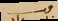قف
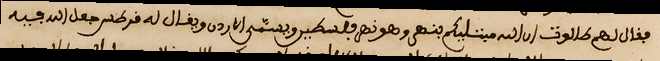فقال لهم طالوت ان الله مبتليكم بنهر وهو نهر فلسطين ويسمى الاردن ويقال له قرطس جعل الله فيه
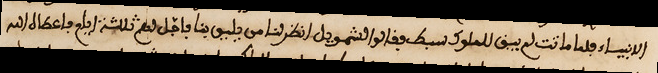الانبياء فلما ماتت لم يبق للملوك سبط فقالوا لشمويل انظر لنا من يليق بنا فاجل لهم ثلاثة ايام فاعطاه الله
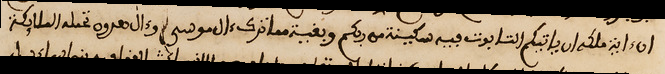ان ءاية ملكه ان ياتيكم التابوت فيه سكينة من ربكم وبقية مما ترك ءال موسى وءال هرون تحمله الملائكة
